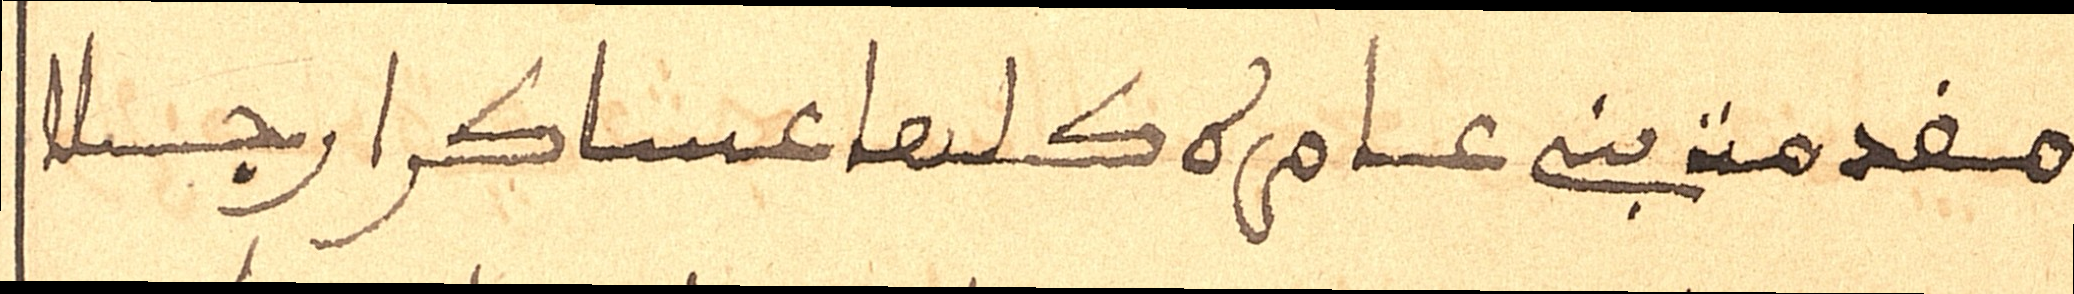مقدمة بنى عامره كلها عساكرا رجلا
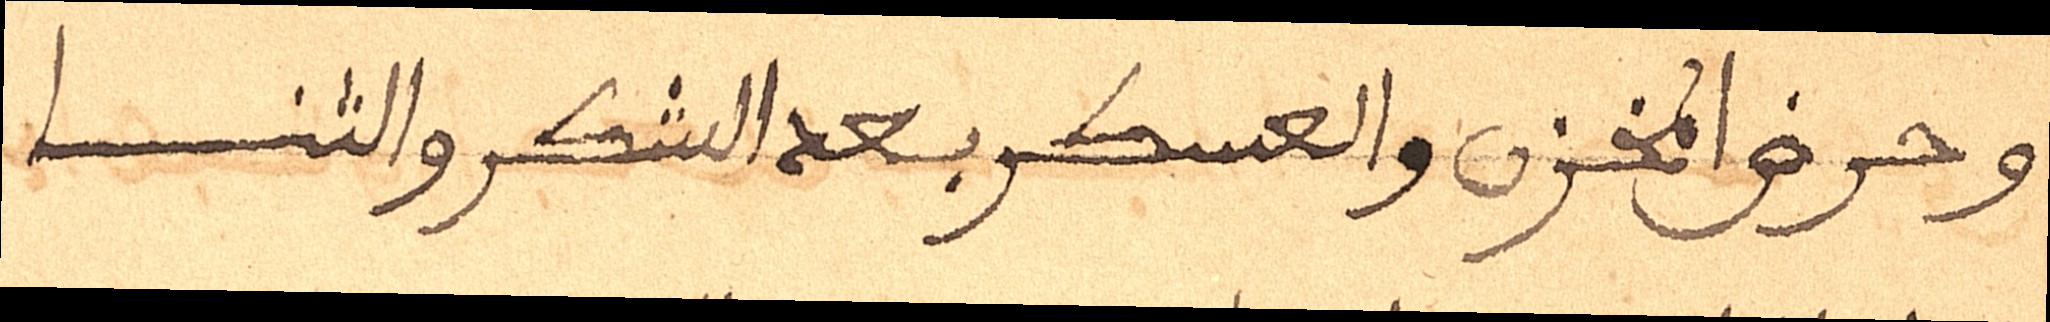وحرض المخزن والعسكر بعد الشكر والثنا
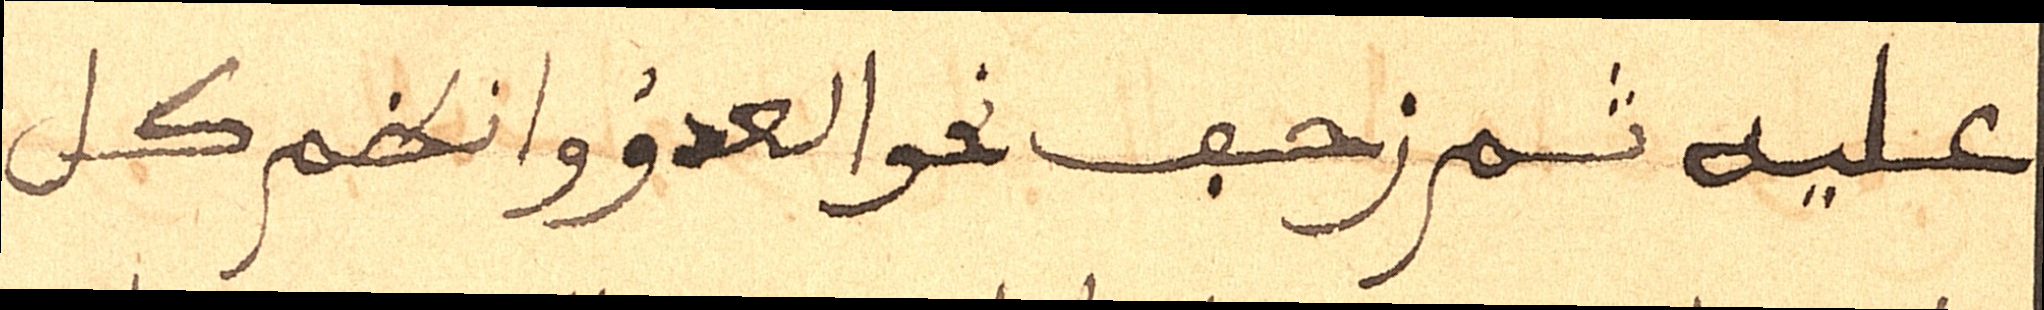عليه ثم زحف نحو العدو وانظم كل
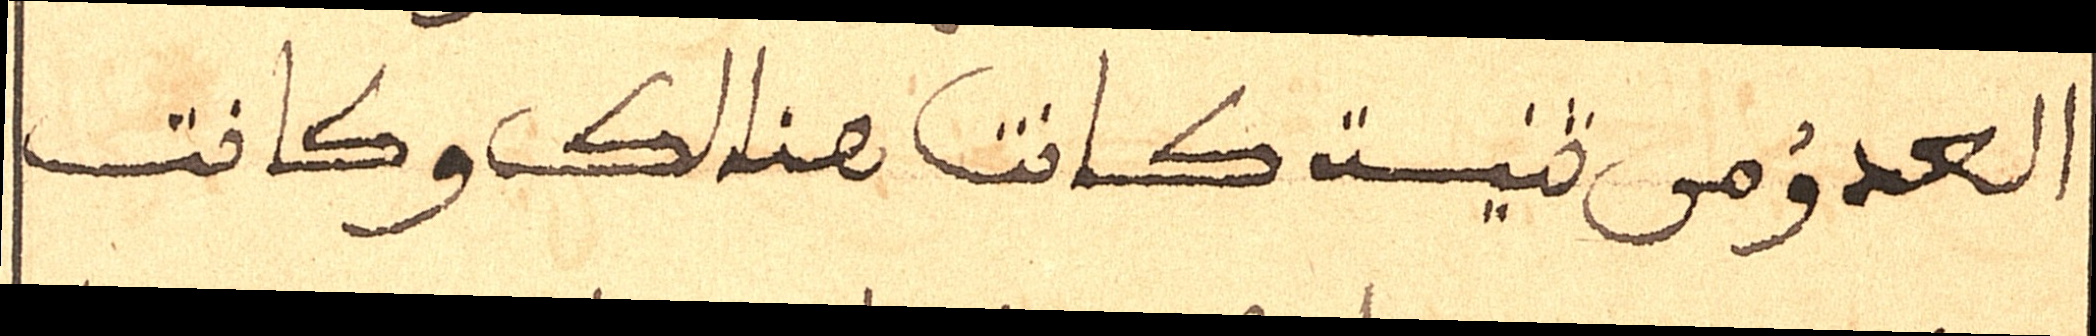العدو من ثنية كانت هنالك وكانت
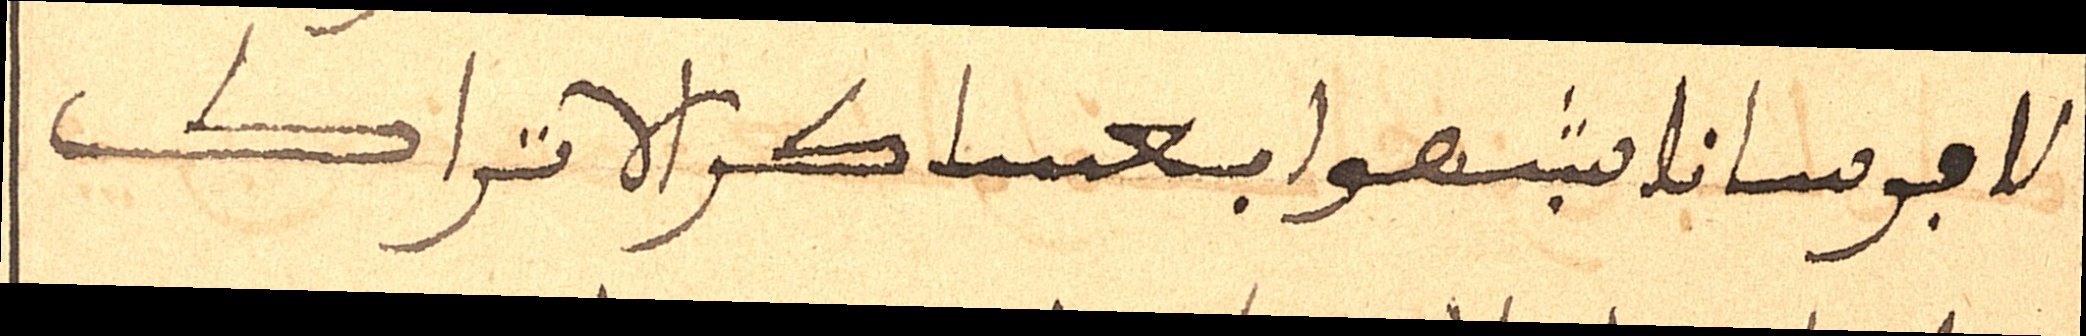لافرسانا بشهوا بعساكر الاتراك
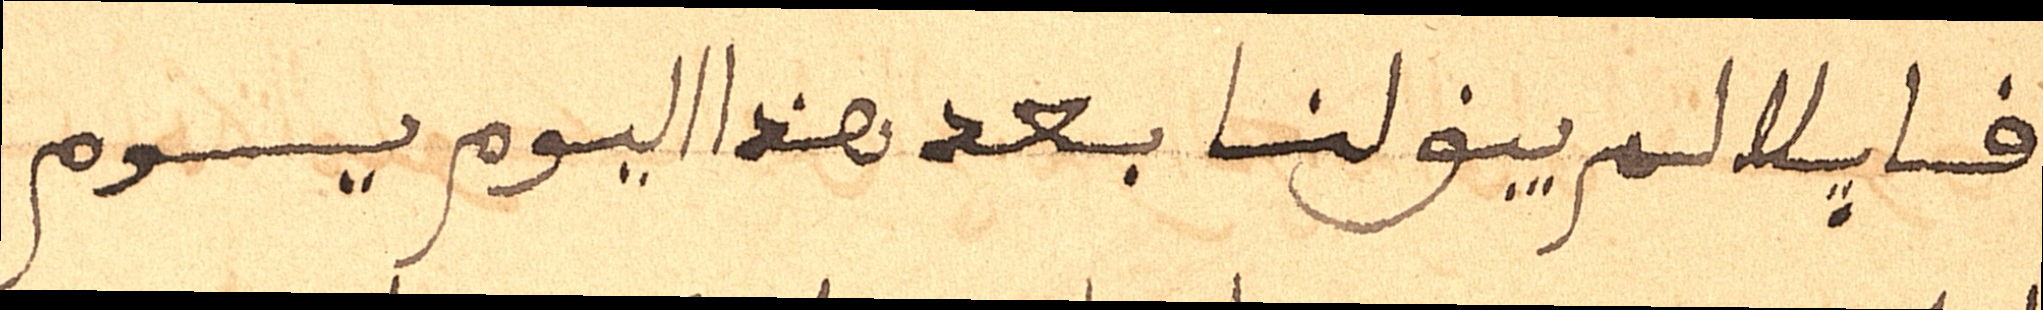قائلا لم يبق لنا بعد هذا اليوم يوم
